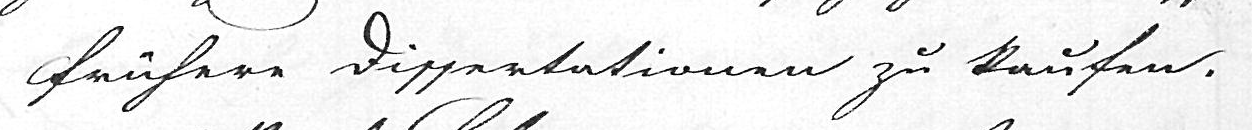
frühere Dissertationen zu kaufen.
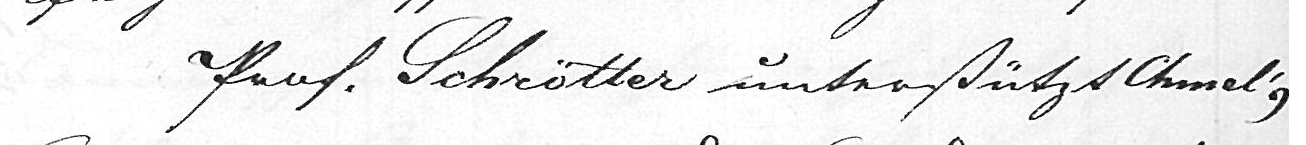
Prof. Schrötter unterstützt Chmel's
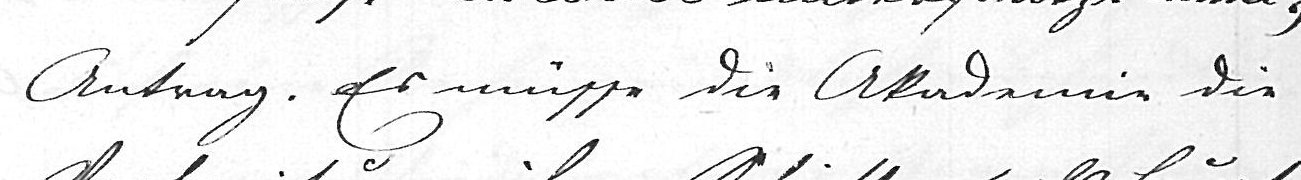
Antrag. Es müsse die Akademie die
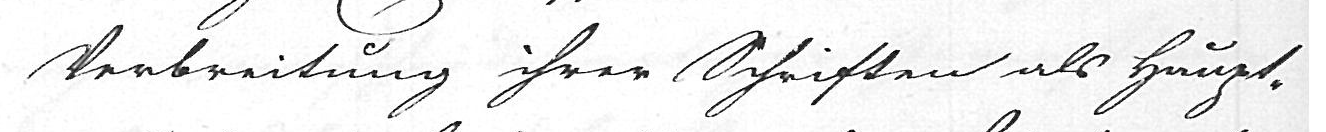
Verbreitung ihrer Schriften als Haupt-
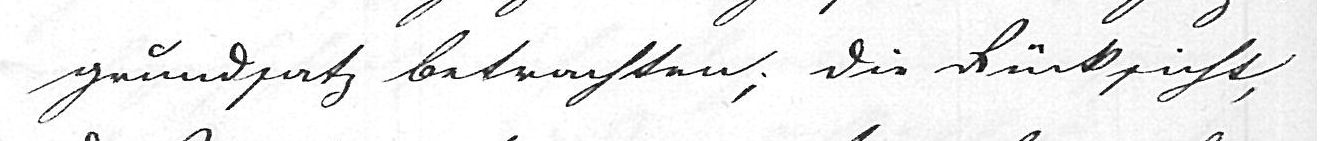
grundsatz betrachten, die Rücksicht,
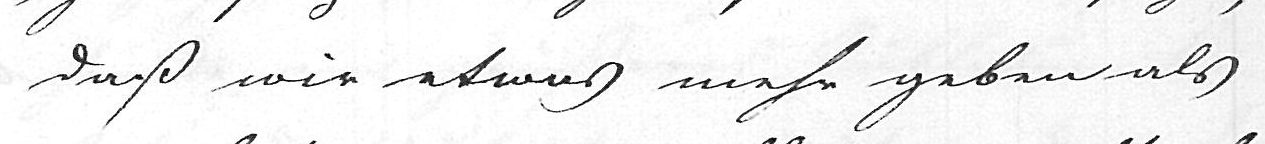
daß wir etwas mehr geben als
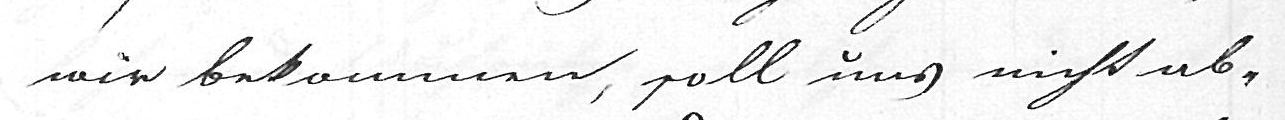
wir bekommen, soll uns nicht ab-
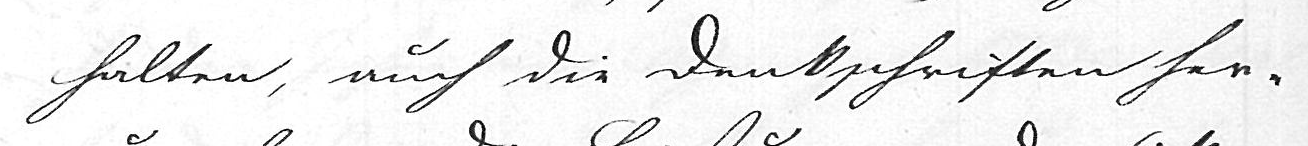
halten, auch die Denkschriften her-
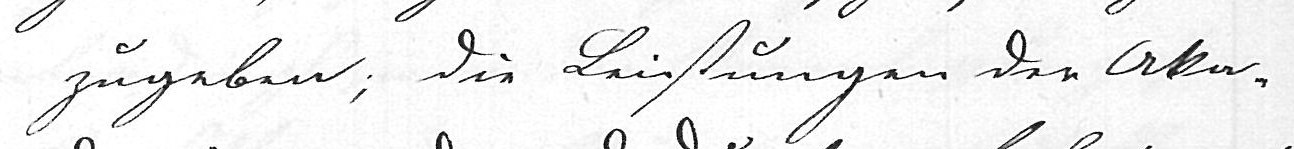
zugeben, die Leistungen der Aka-
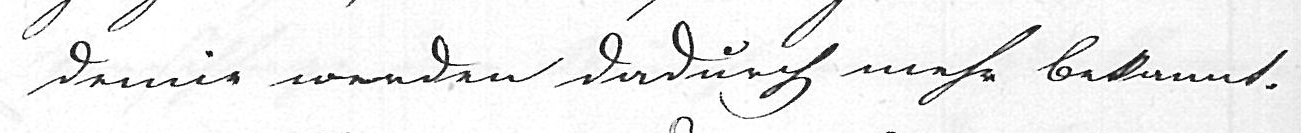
demie werden dadurch mehr bekannt.
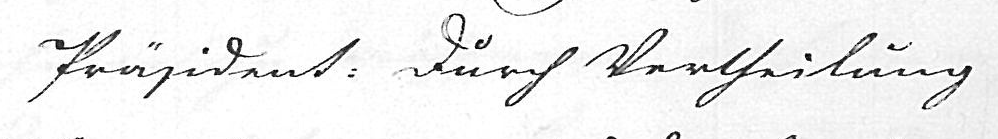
Präsident: Durch Vertheilung
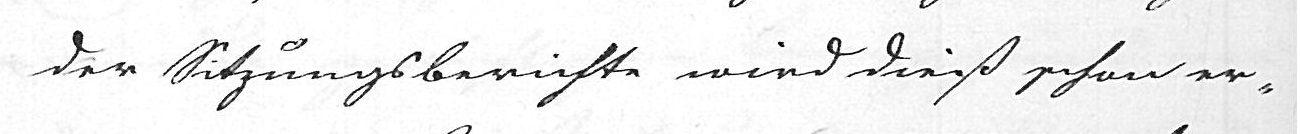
der Sitzungsberichte wird dieß schon er-
